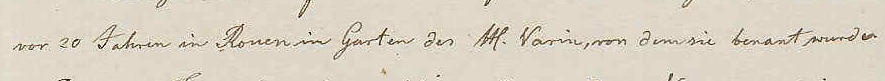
vor 20 Jahren in Rouen im Garten des H￼. Varin, von dem sie benant wurde.
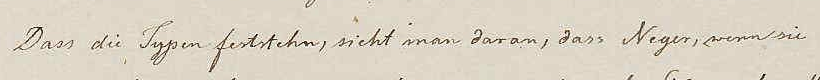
Dass die Typen feststehn, sieht man daran, dass Neger, wenn sie
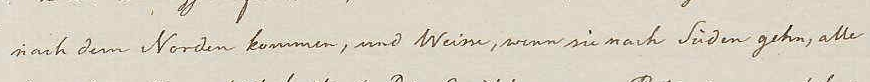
nach dem Norden kommen, und Weisse, wenn sie nach Süden gehn, alle
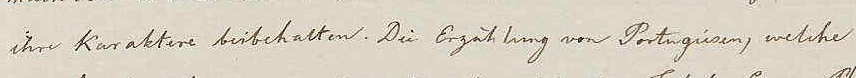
ihre Karaktere beibehalten. Die Erzählung von Portugiesen, welche
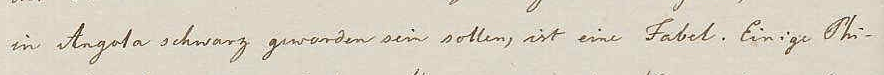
in Angola schwarz geworden sein sollen, ist eine Fabel. Einige Phi-
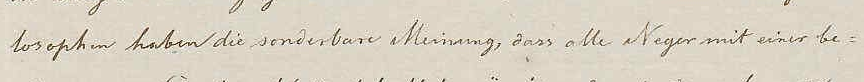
losophen haben die sonderbare Meinung, dass alle Neger mit einer be-
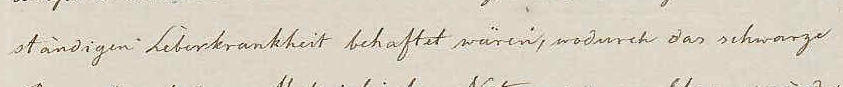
ständigen Leberkrankheit behaftet wären, wodurch das schwarze
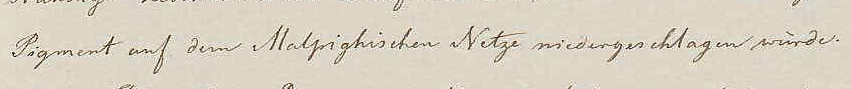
Pigment auf dem Malpighischen Netze niedergeschlagen würde.
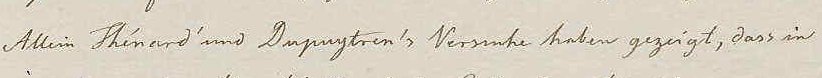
Allein Thénard' und Dupuytren's Versuche haben gezeigt, dass in
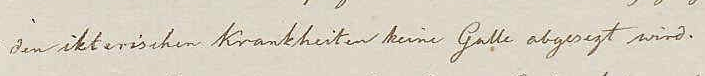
den ikterischen Krankheiten keine Galle abgesezt wird.
